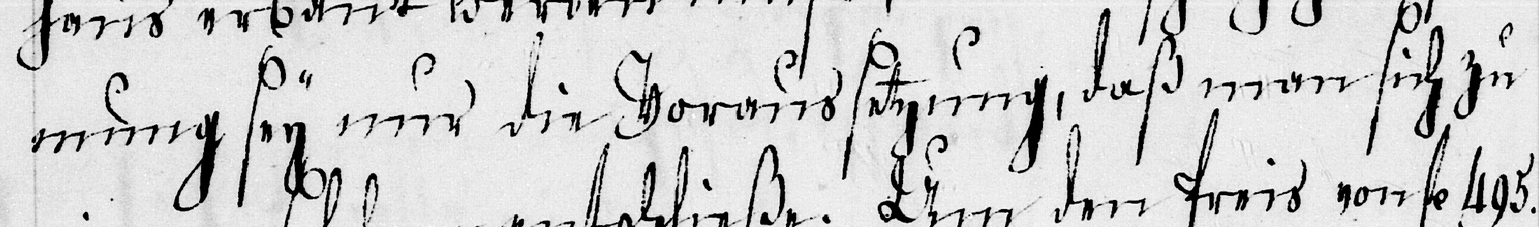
mung sey nur die Voraussetzung, daß man sich zu
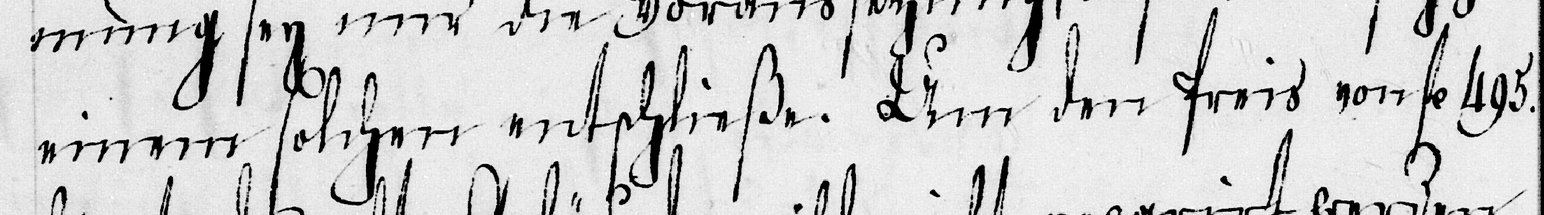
einem solchen entschließe. Um den Preis von fl. 495.
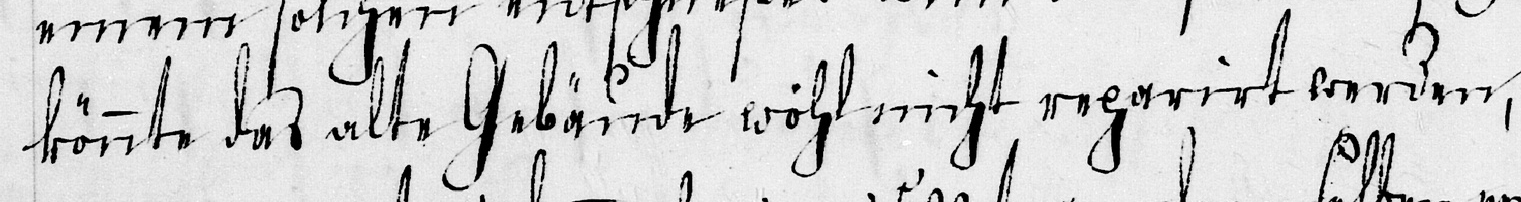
könnte das alte Gebäude wohl nicht reparirt werden,
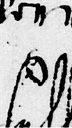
es
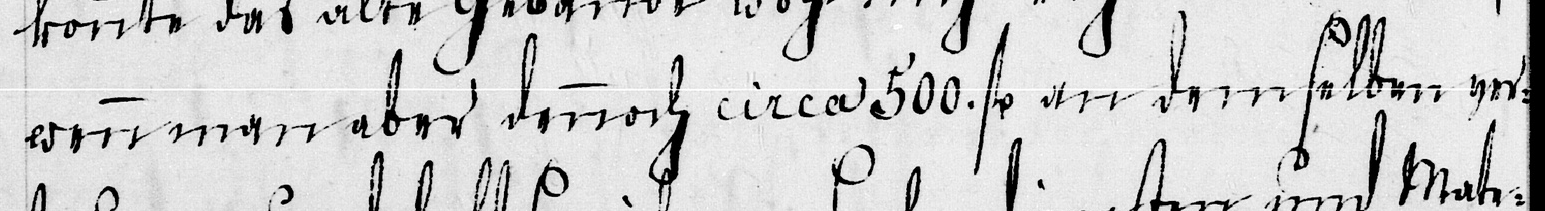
wenn man aber dennoch circa 500. fl. an demselben ver¬
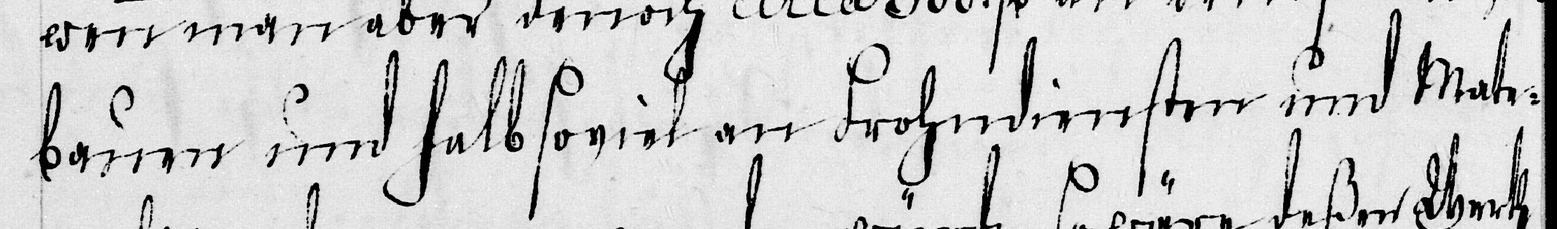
bauen und halb soviel an Frohndiensten und Mate¬
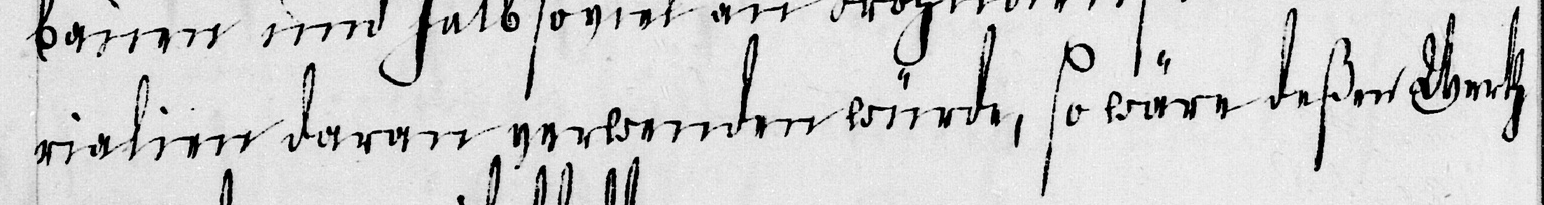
rialien daran verwenden würde, so wäre deßen Werth
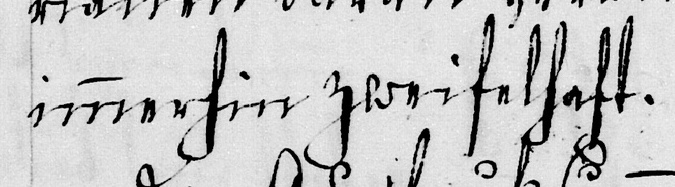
immerhin zweifelhaft.
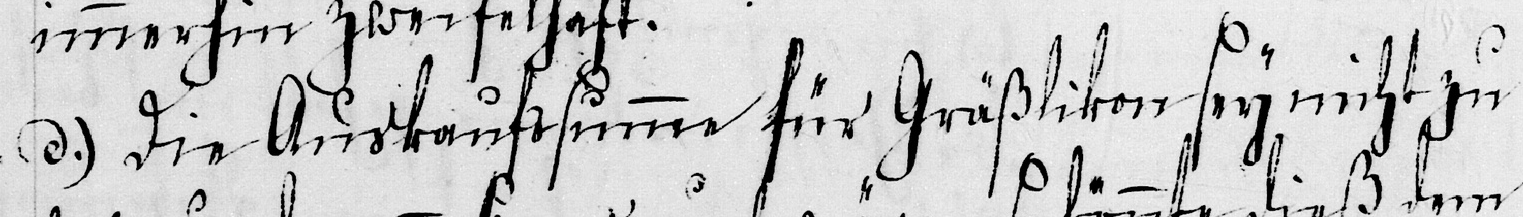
d.) Die Auskaufssumme für Gräßlikon sey nicht zu
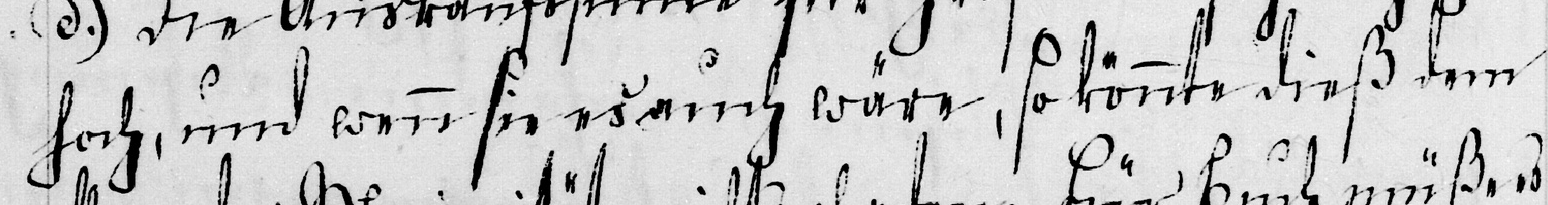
hoch, und wenn sie es auch wäre, so könnte dieß dem
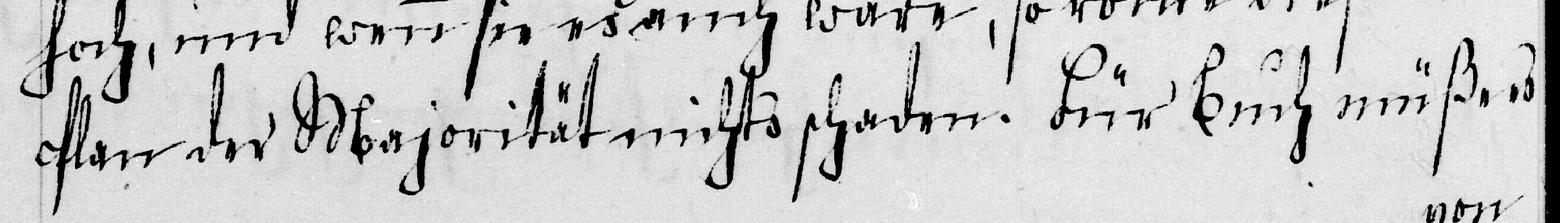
Plan der Majorität nichts schaden. Für Buch müße
